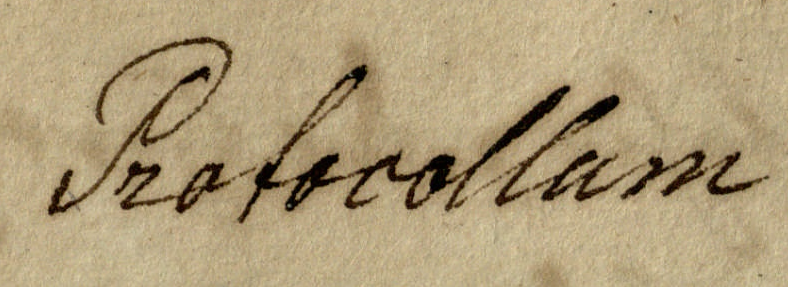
Protocollum
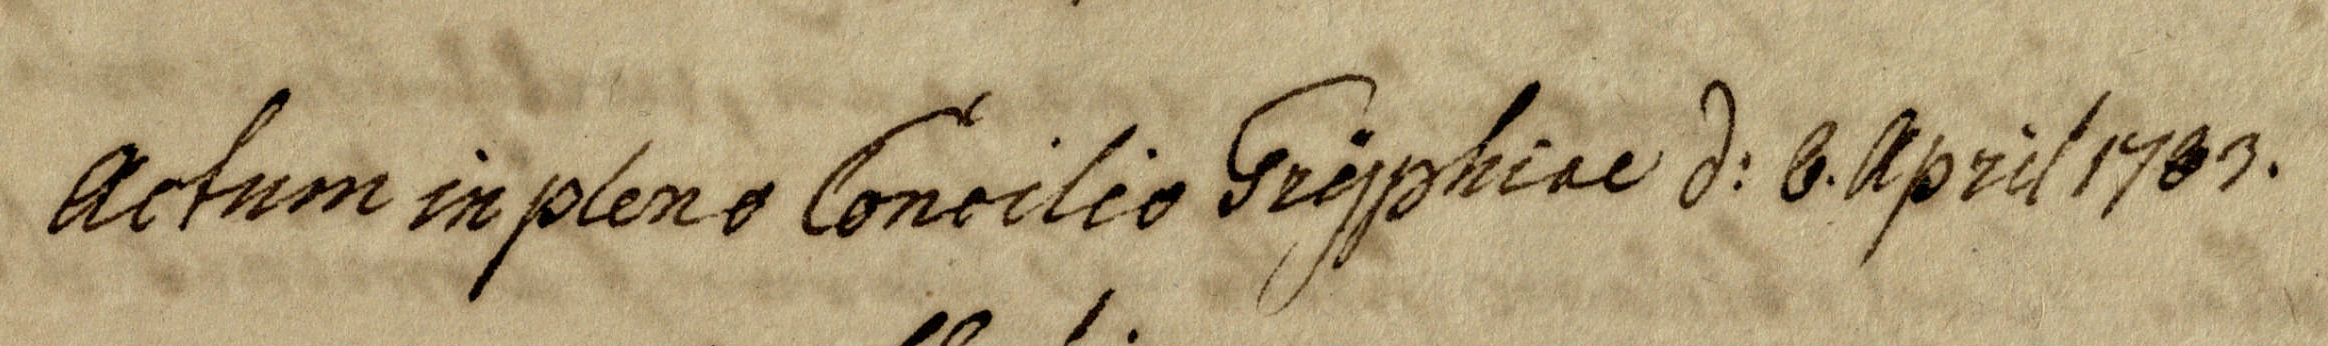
Actum in pleno Concilio Grÿphiae d. 8. April 1783.
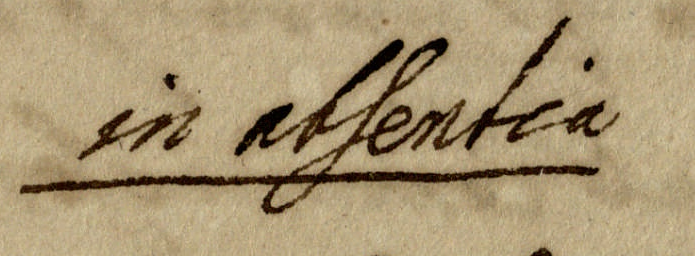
in absentia
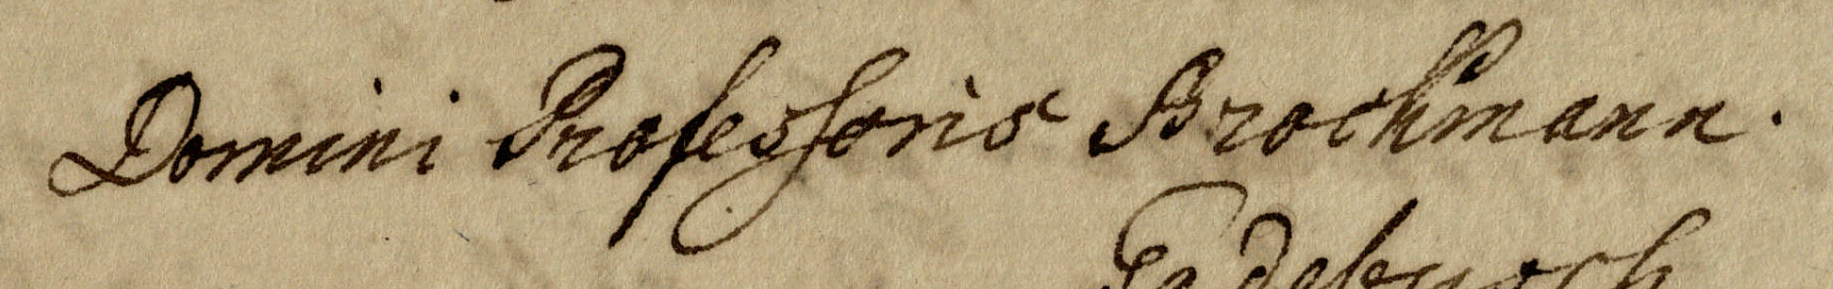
Domini Professoris Brockmann
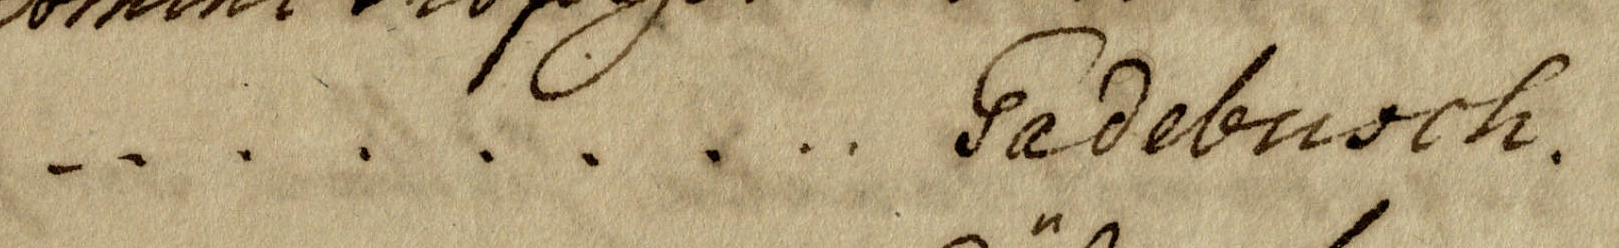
Gadebusch
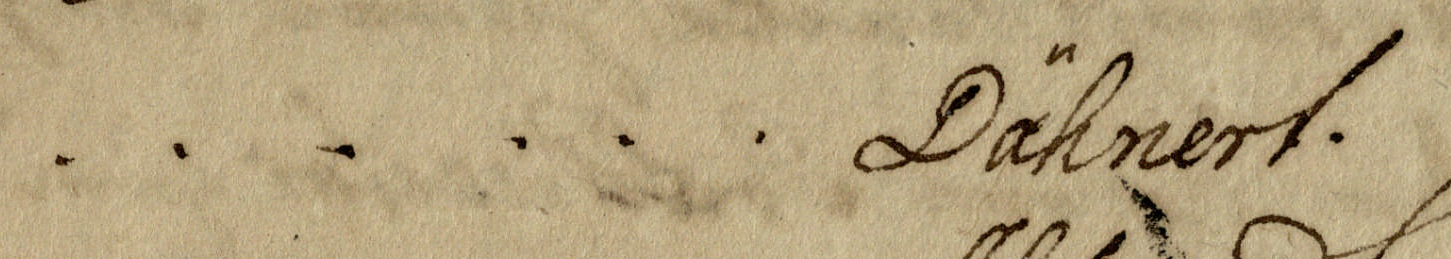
Dähnert.
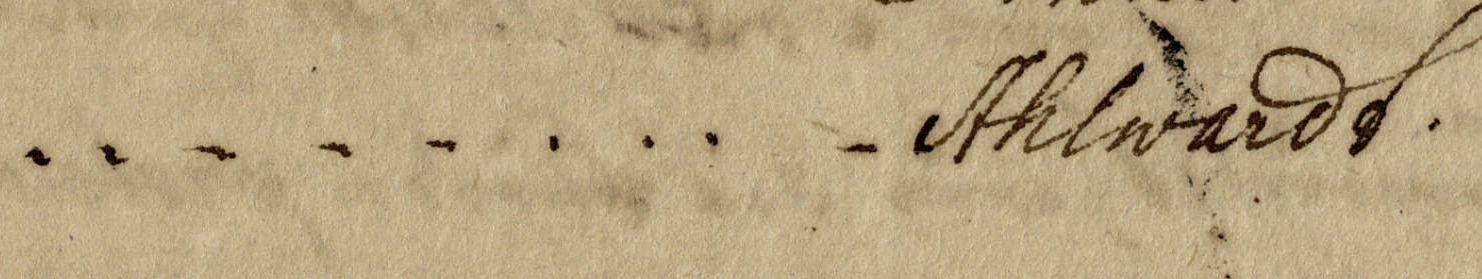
Ahlwardt.
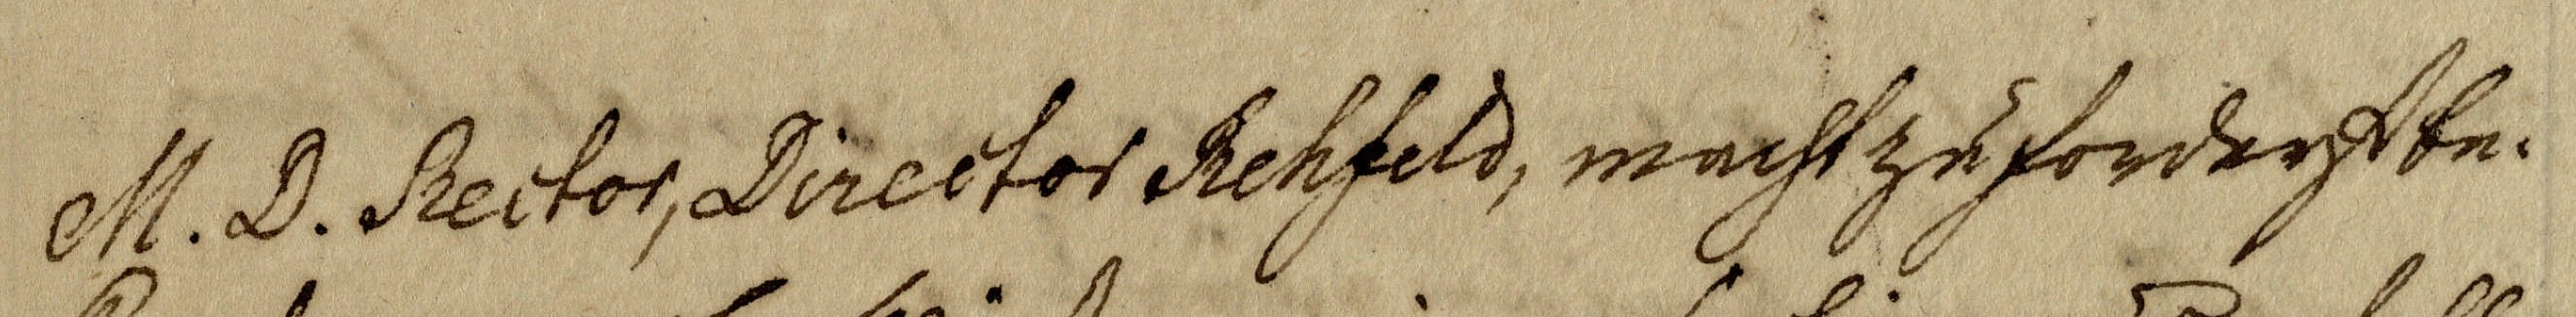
M. D. Rector, Director Rehfeld, macht zu forderst be¬
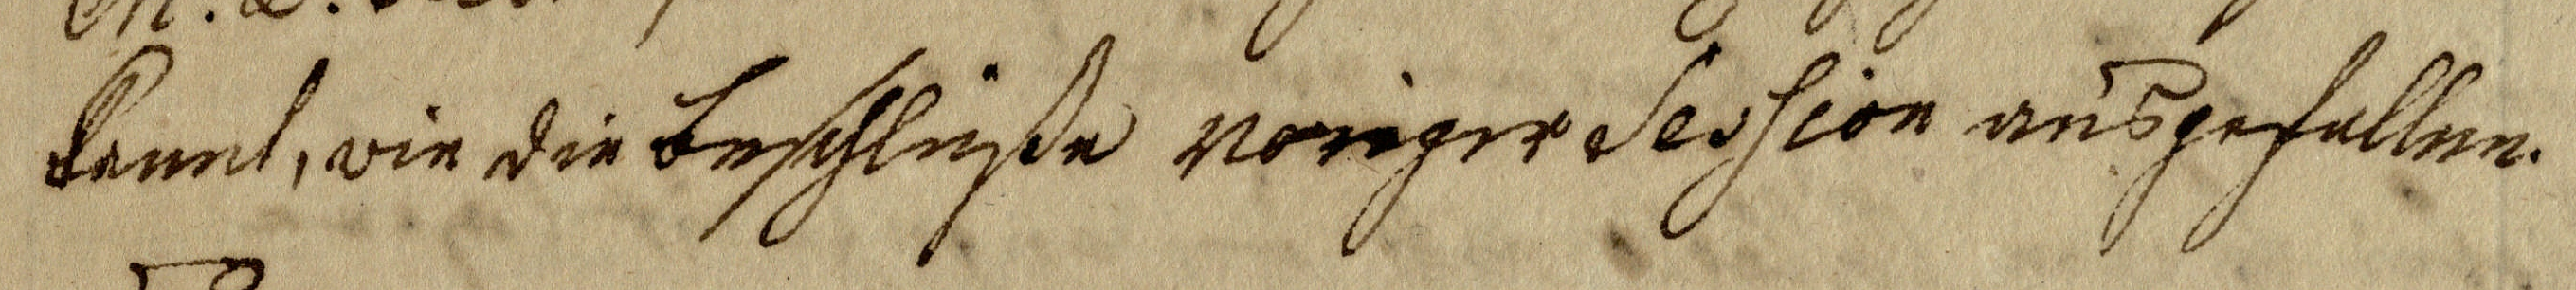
kannt, wie die Beschlüße voriger Session ausgefallen
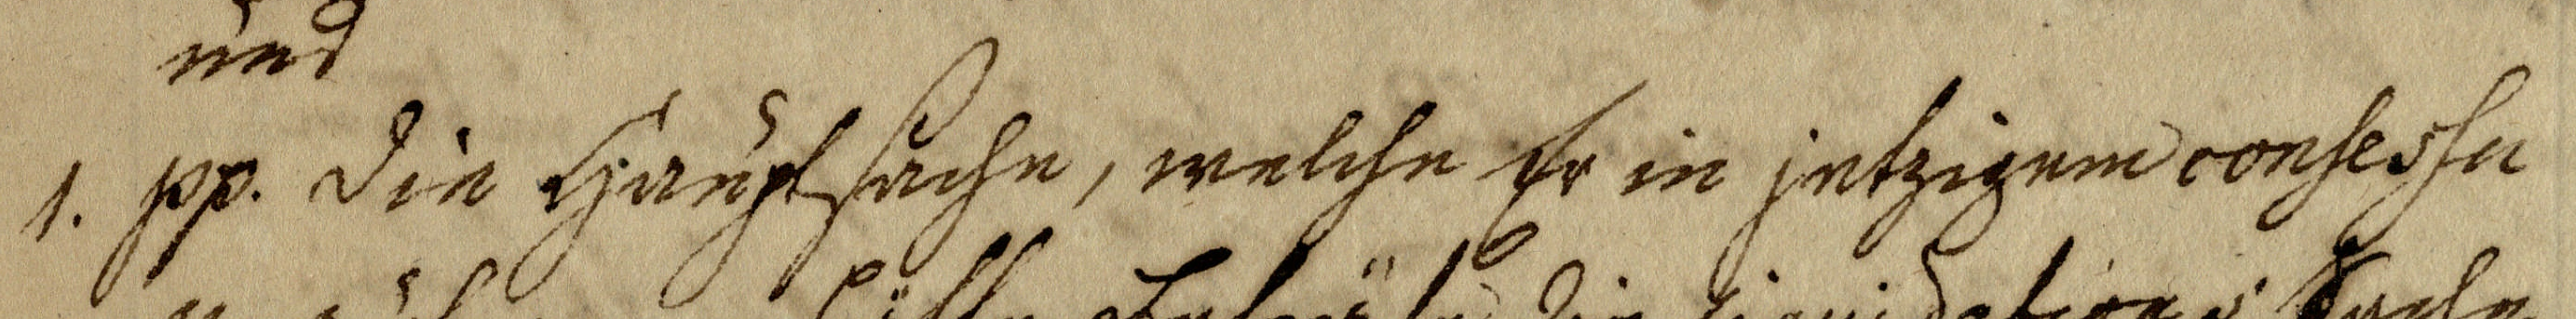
1. ppt. die Hauptsache, welche Er in jetzigem consessu
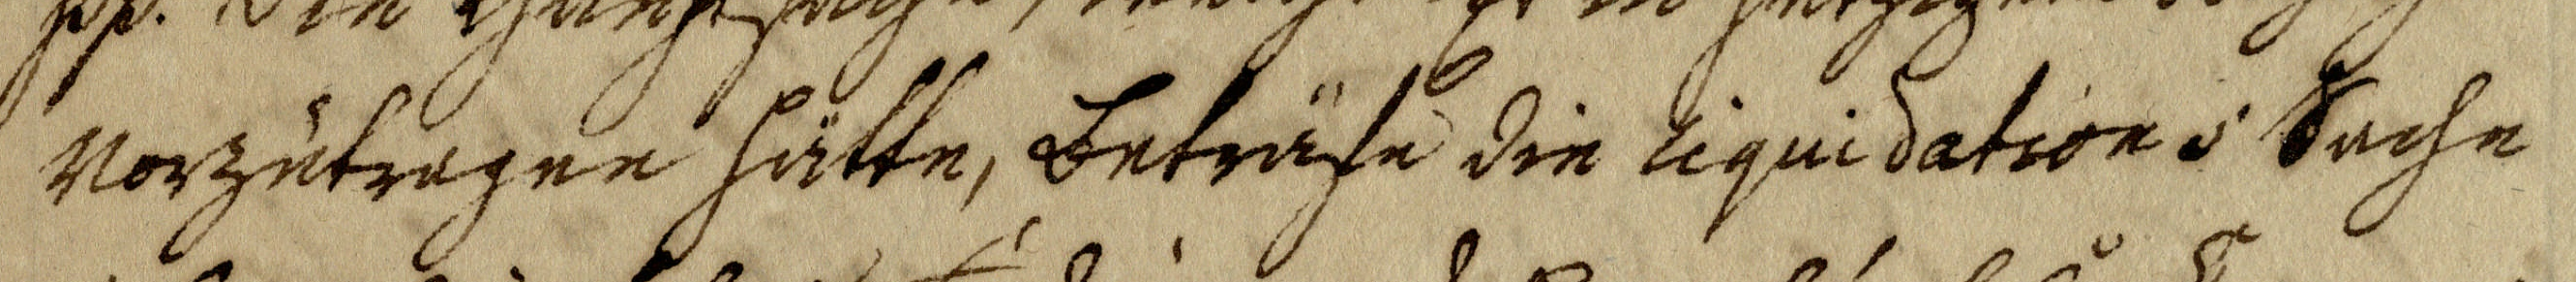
vorzutragen hätte, beträfe die liquidations Sache
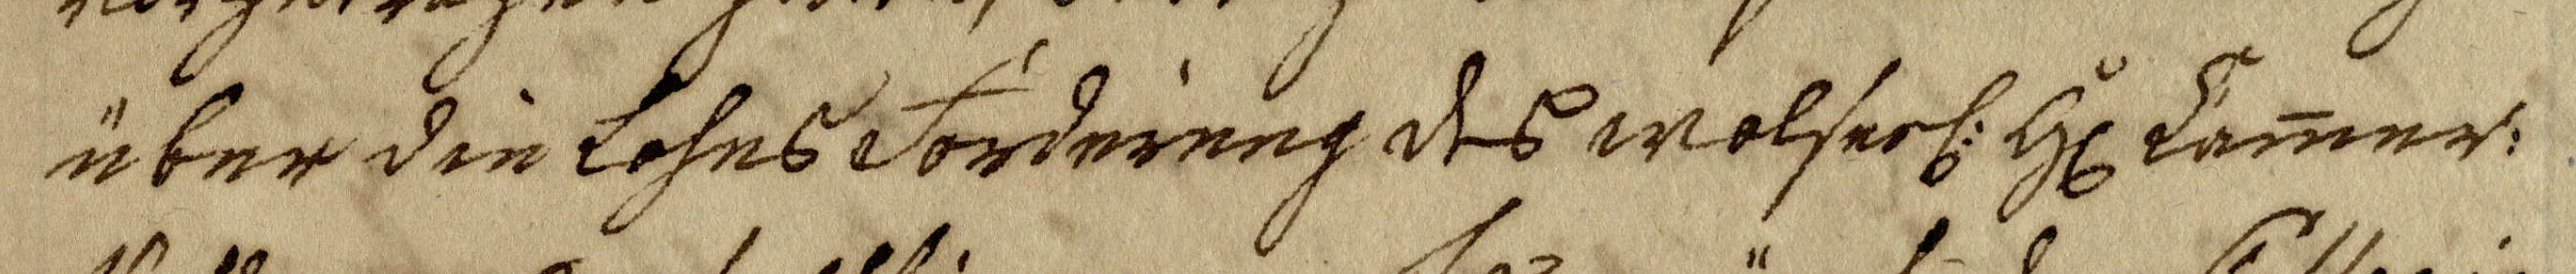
über die Lohns Forderung des wolseel. H Camer¬
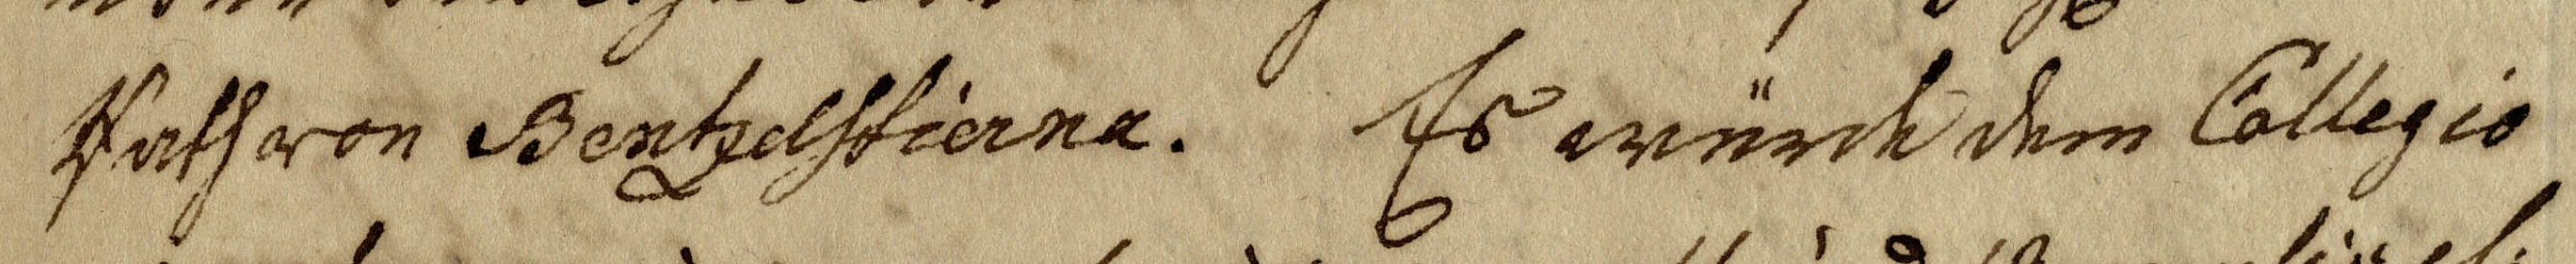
Rath von Bentzelstierna. Es würde dem Collegio
